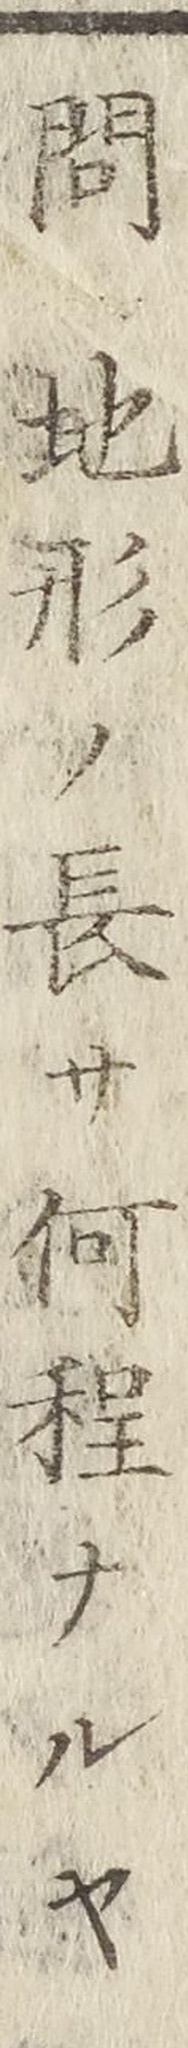問地形ノ長サ何程ナルヤ
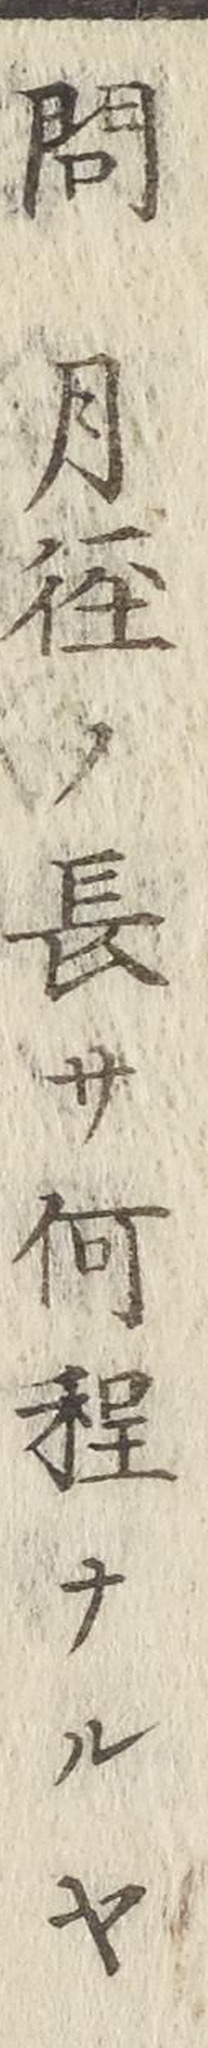問月径ノ長サ何程ナルヤ
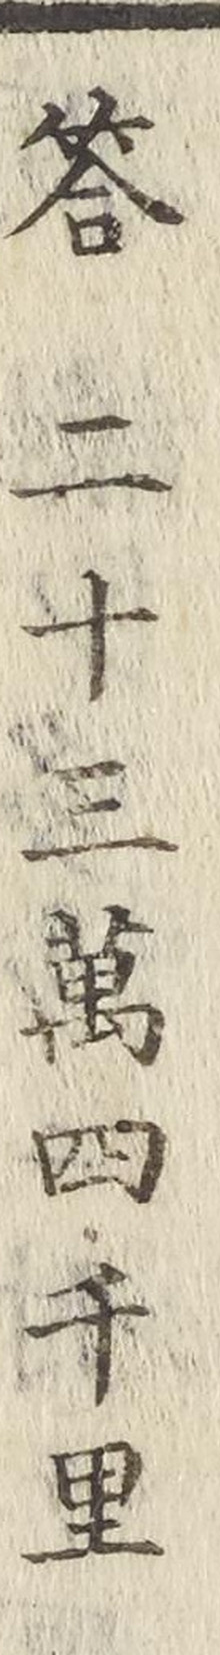答二十三万四千里
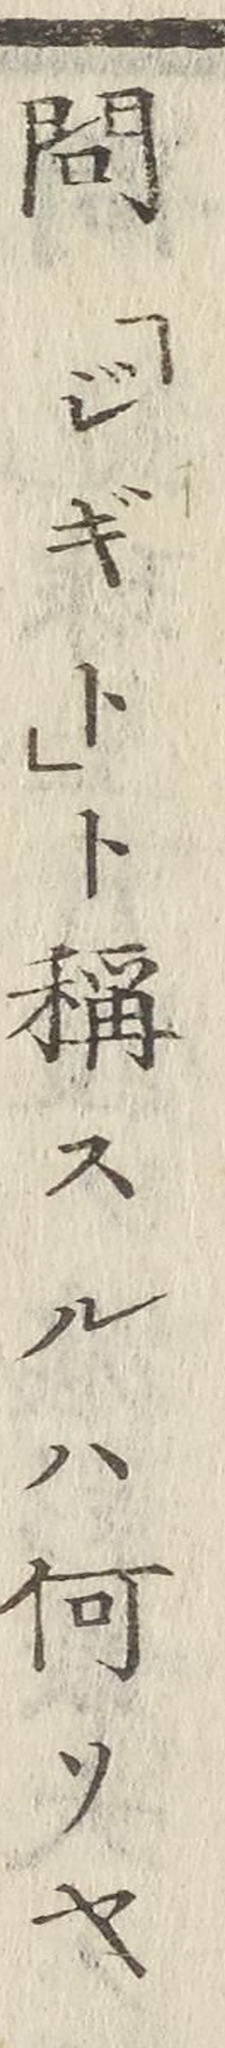問「ジギト」ト称スルハ何ソヤ
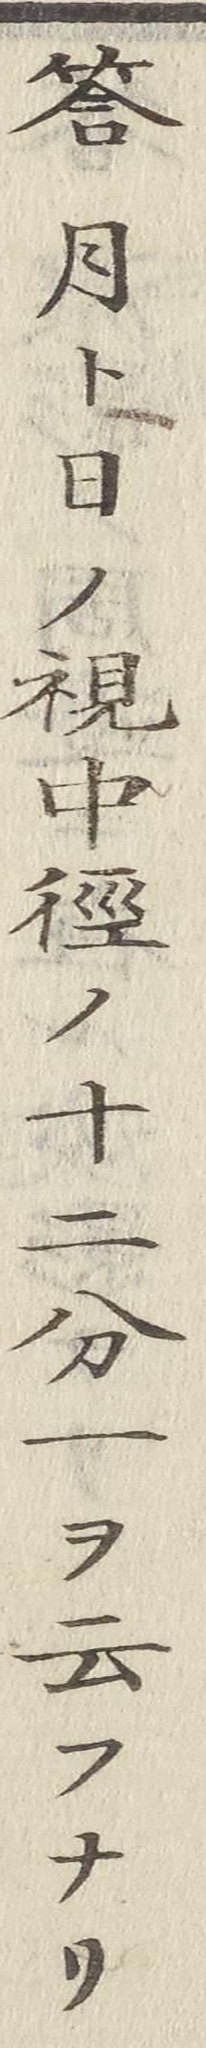答月ト日ノ視中径ノ十二分一ヲ云フナリ
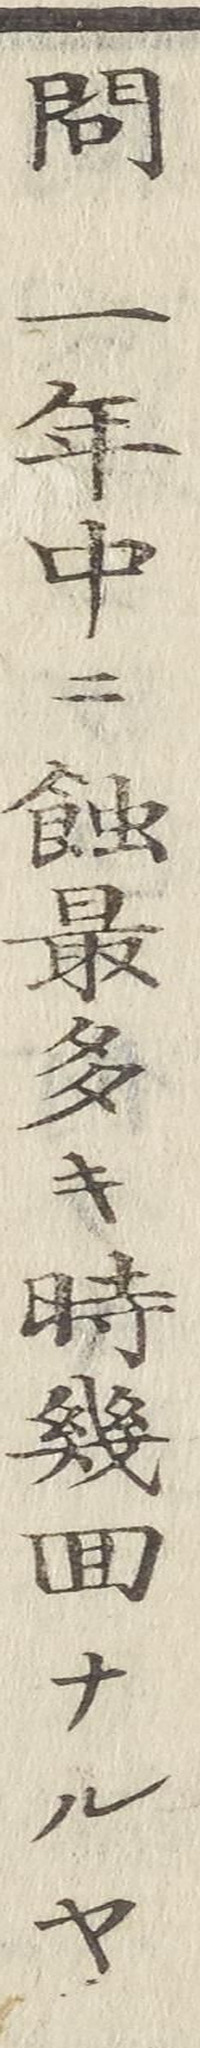問一年中ニ蝕最多キ時幾回ナルヤ
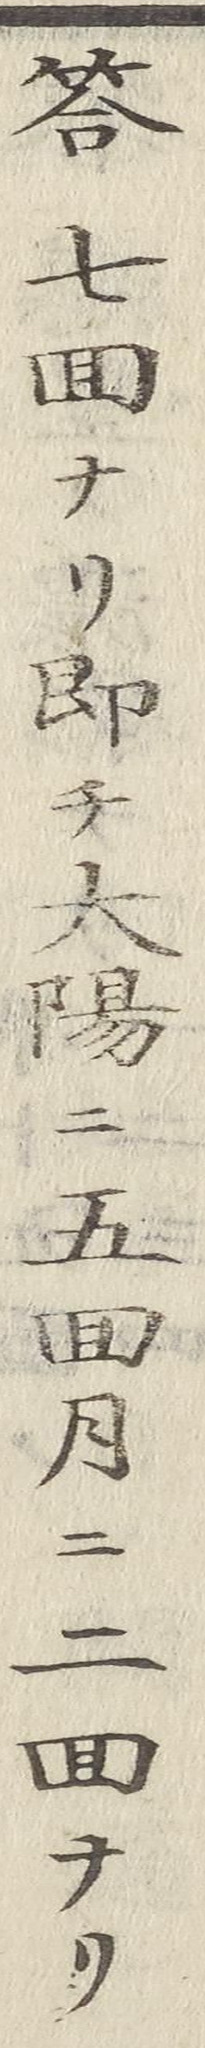答七回ナリ即チ大陽ニ五回月ニ二回ナリ
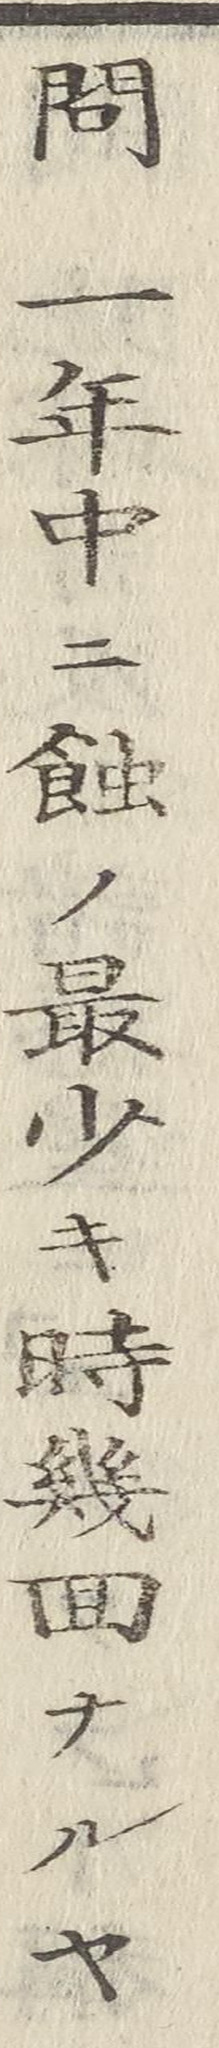問一年中ニ蝕ノ最少キ時幾回ナルヤ
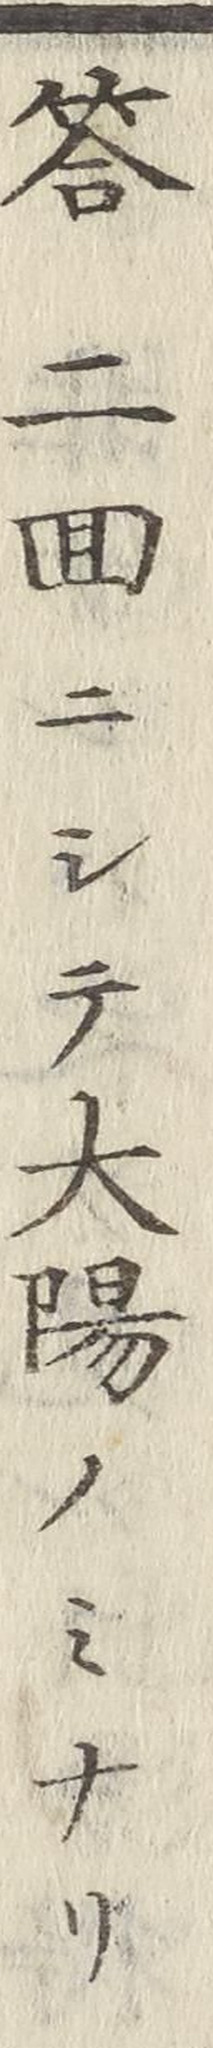答二回ニシテ大陽ノミナリ
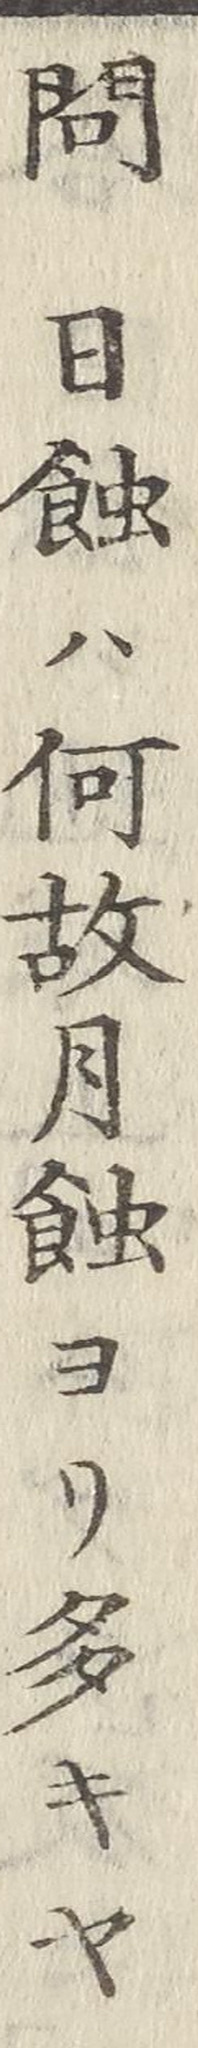問日蝕ハ何故月蝕ヨリ多キヤ
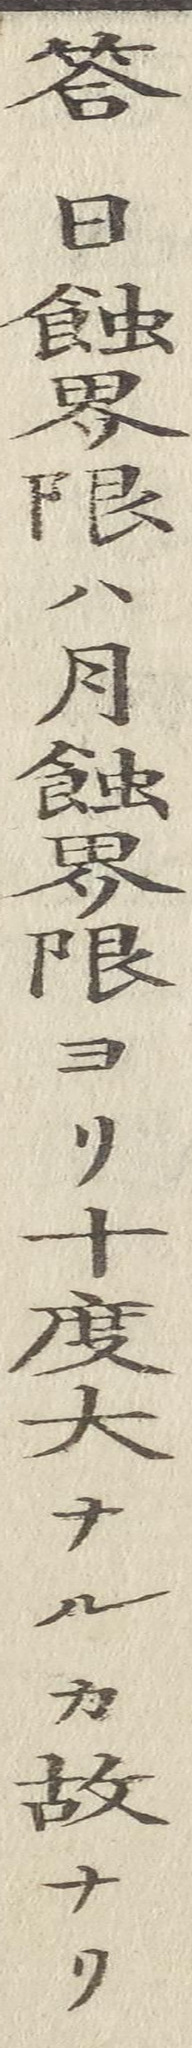答日蝕界限ハ月蝕界限ヨリ十度大ナルカ故ナリ
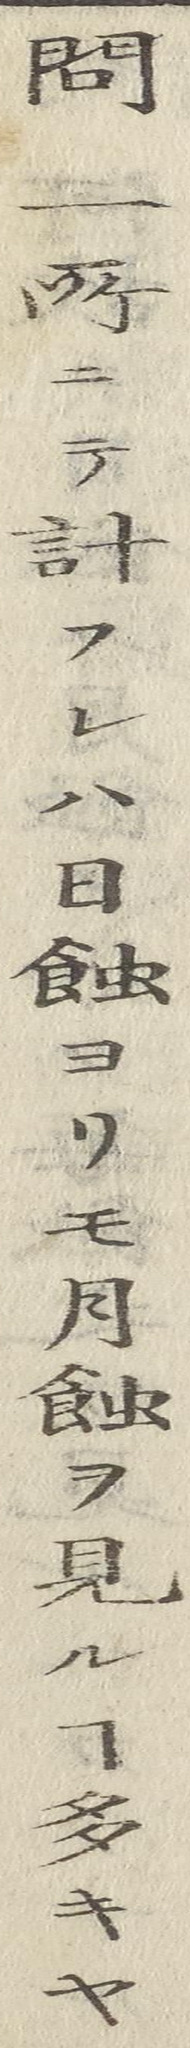問一所ニテ計フレハ日蝕ヨリモ月蝕ヲ見ルコト多キヤ
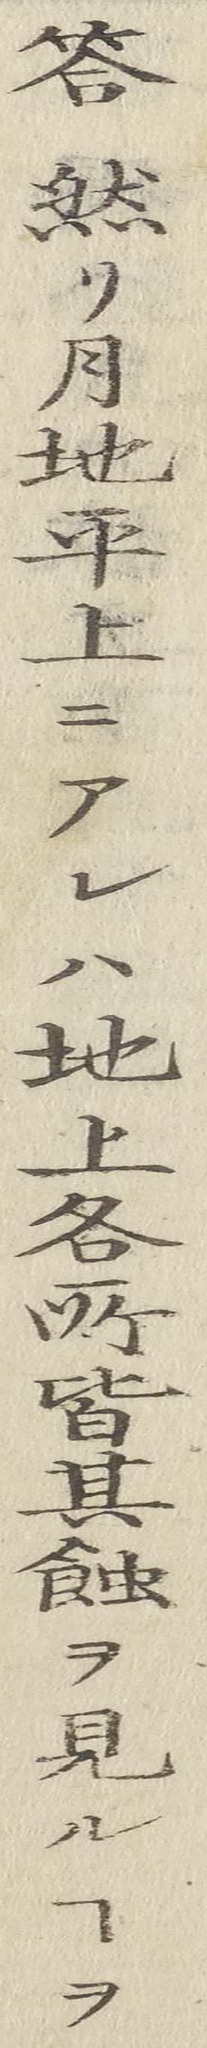答然リ月地平上ニアレハ地上各所皆其蝕ヲ見ルコトヲ

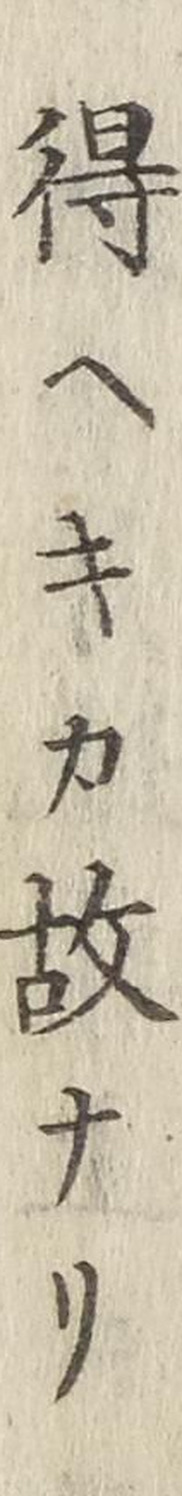得ヘキカ故ナリ
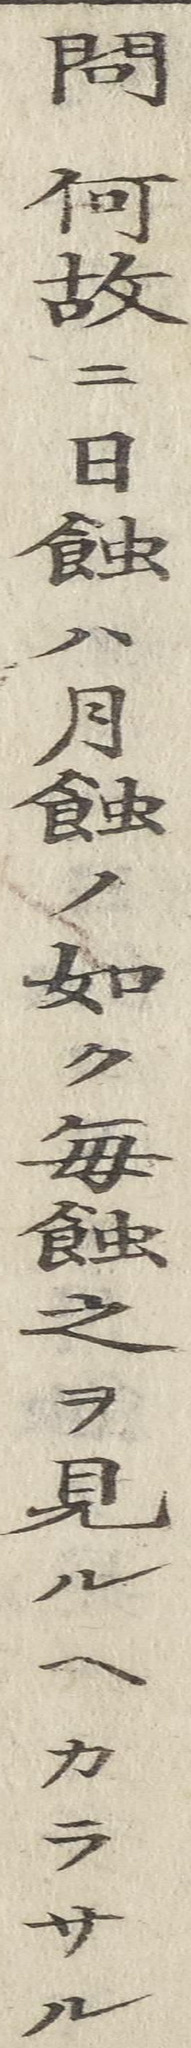問何故ニ日蝕ハ月蝕ノ如ク毎蝕之ヲ見ルヘカラサル
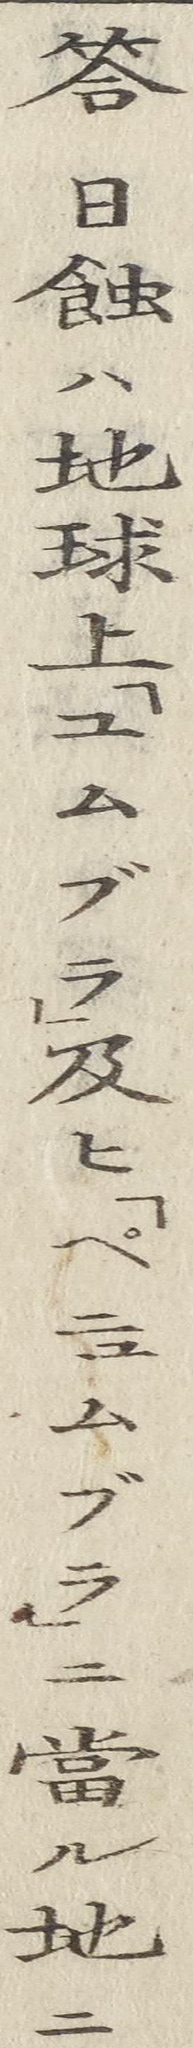答日蝕ハ地球上「ユムブラ」及ヒ「ペニュムブラ」ニ当ル地ニ
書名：星学圖説　下
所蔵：東京大学地震研究所図書室 Earthquake Research Institute Library, The University of Tokyo, JAPAN
